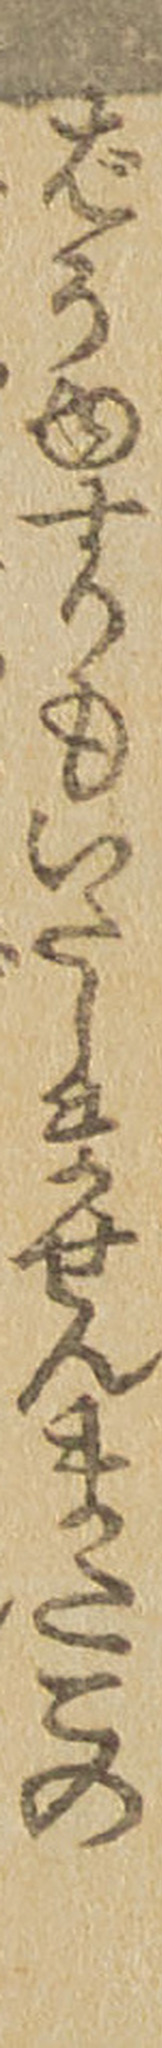ばうゆすりもいたしませんまたこの
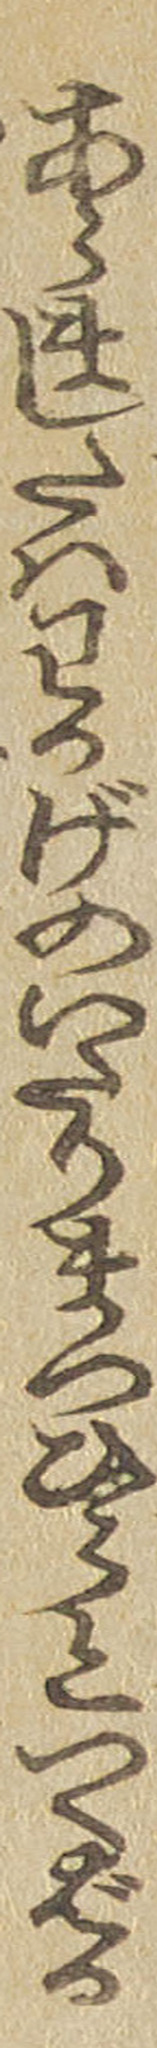あらましたはわかげのいたりまつひらとつくばる
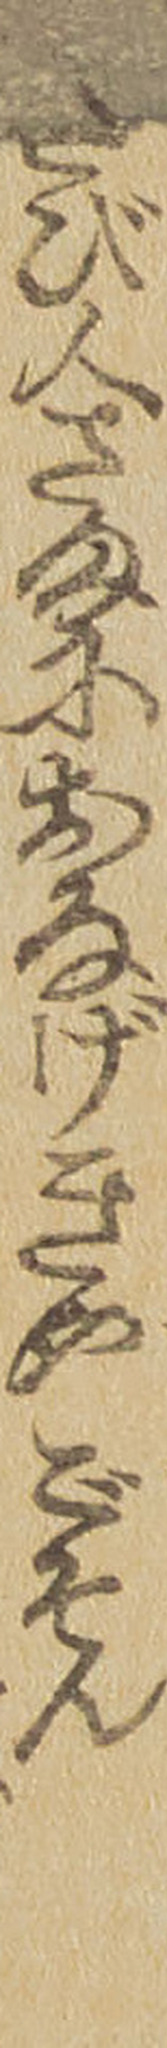たび人さまにおなげきやごそん
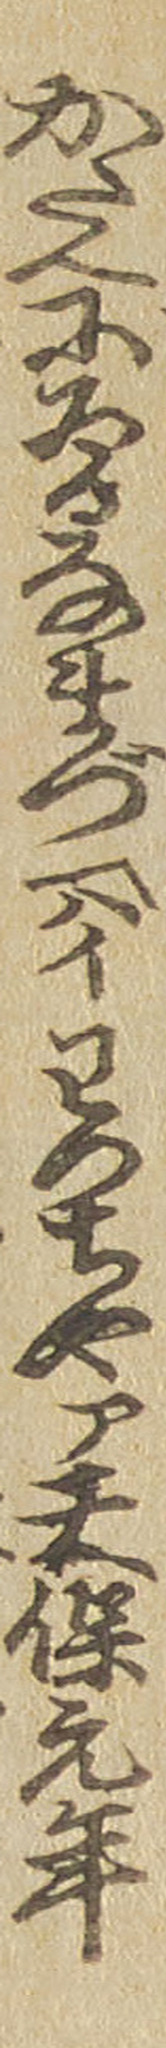かたへにゐるなまづ｢ハイわつちやァ天保元年
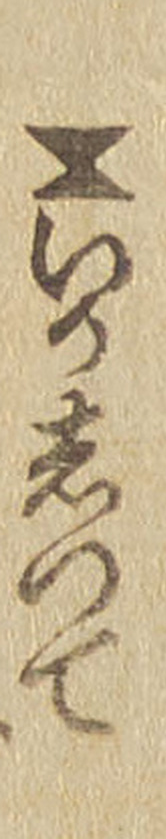▼▲いかしつて
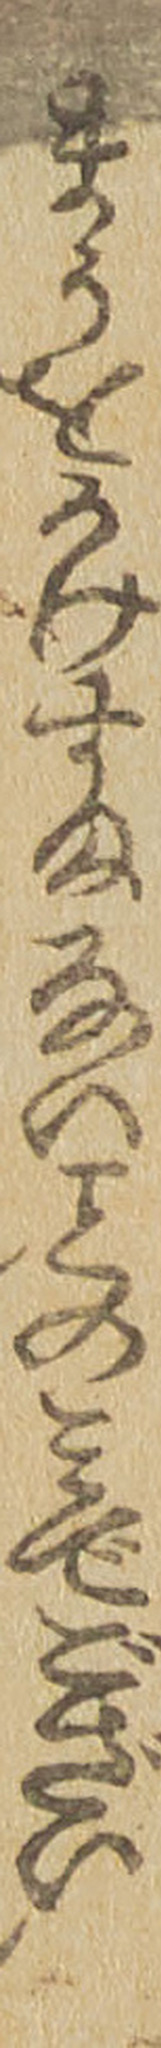まうをかけすまないことのみでござい
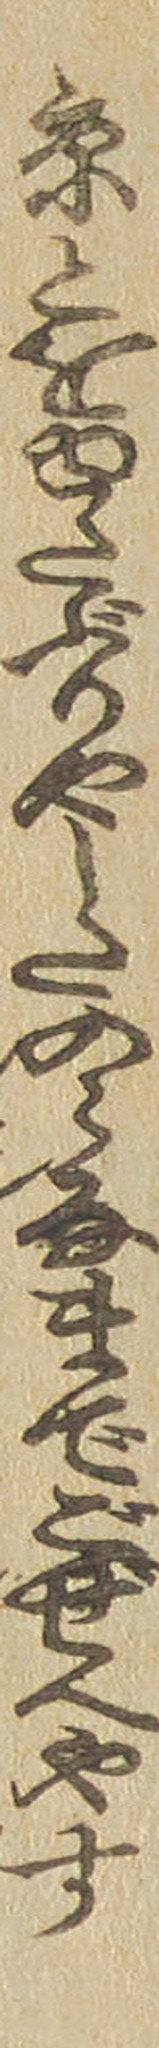京とをゆたぶりやしたのらなまでごぜへやす
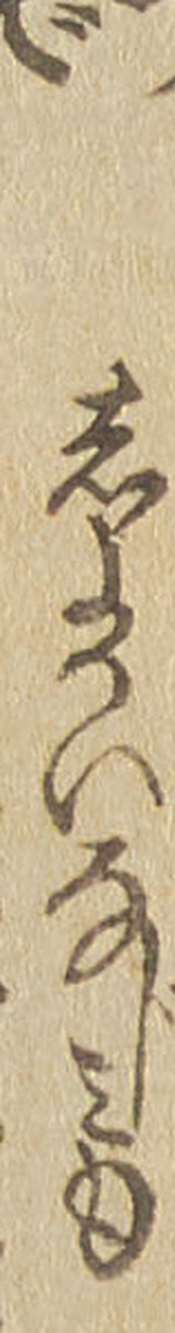しよかいなじみも
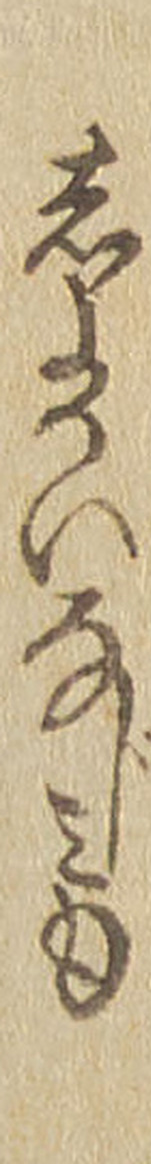しよかいなじみも
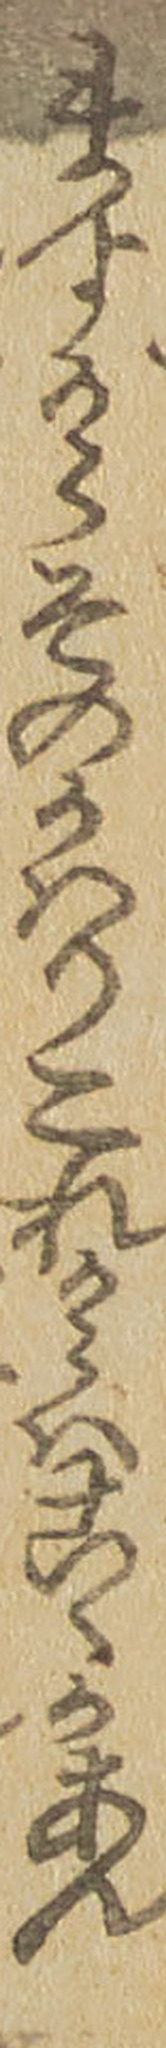ますからそのかはりこれからはこゝかあん
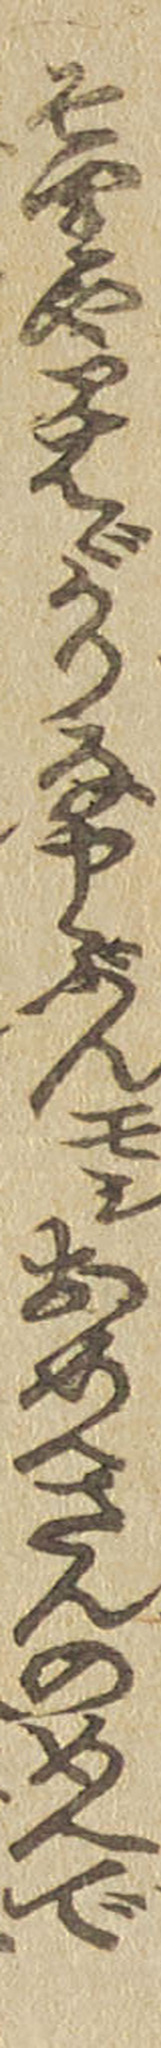そりやァはゞかりな申ぶんモシおめへさんのめへで
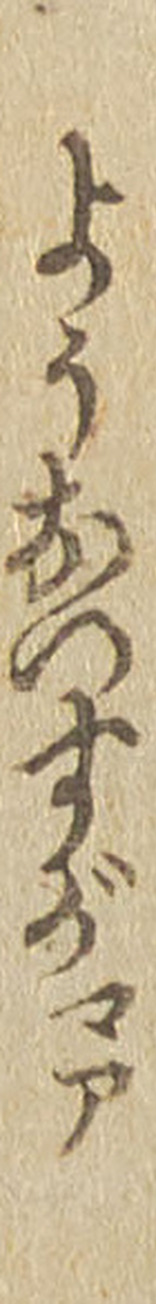ようおつすがマァ
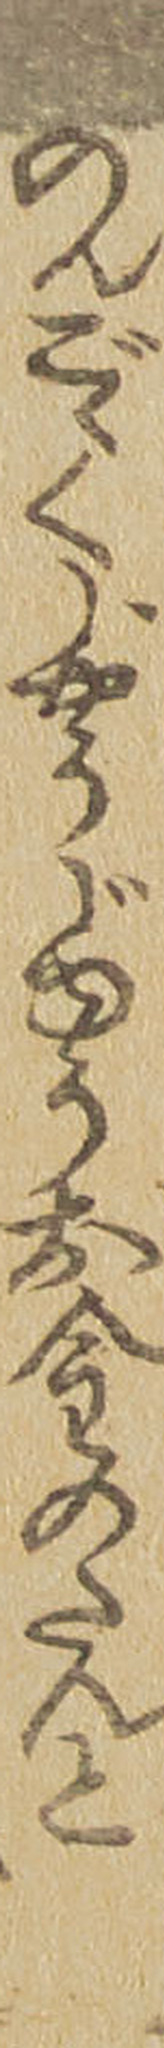のんごゝくじやうじゆうお金のたんと
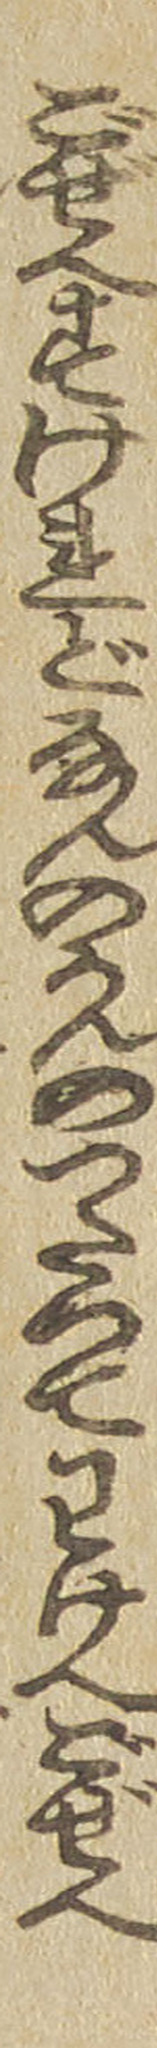ごぜへすけれどなんのかんのつたつてわけへごぜへ
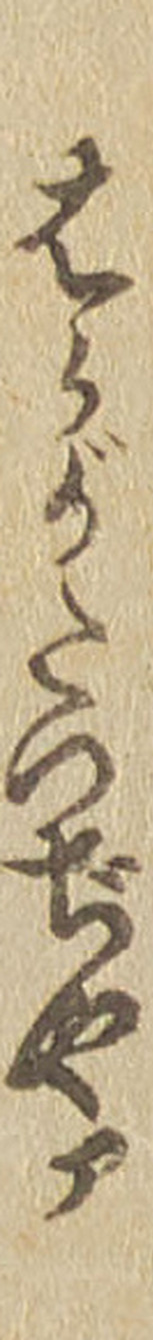はらがたつぢやァ
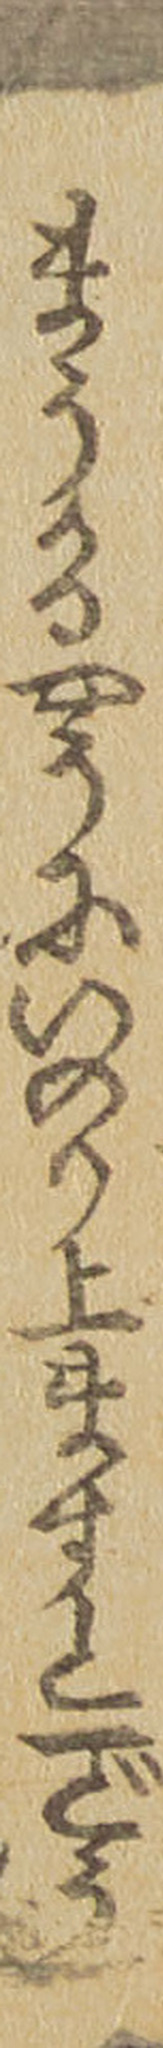まうかるやうにいのり上ますと一どう
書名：地震太平記
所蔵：東京大学総合図書館 General Library in the University of Tokyo, JAPAN
